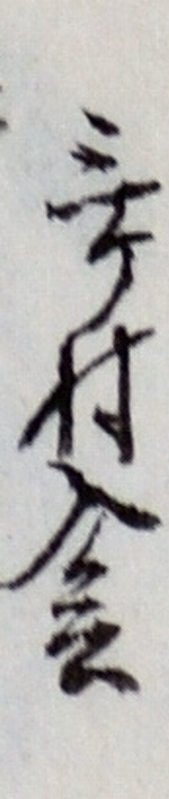三ヶ村入会
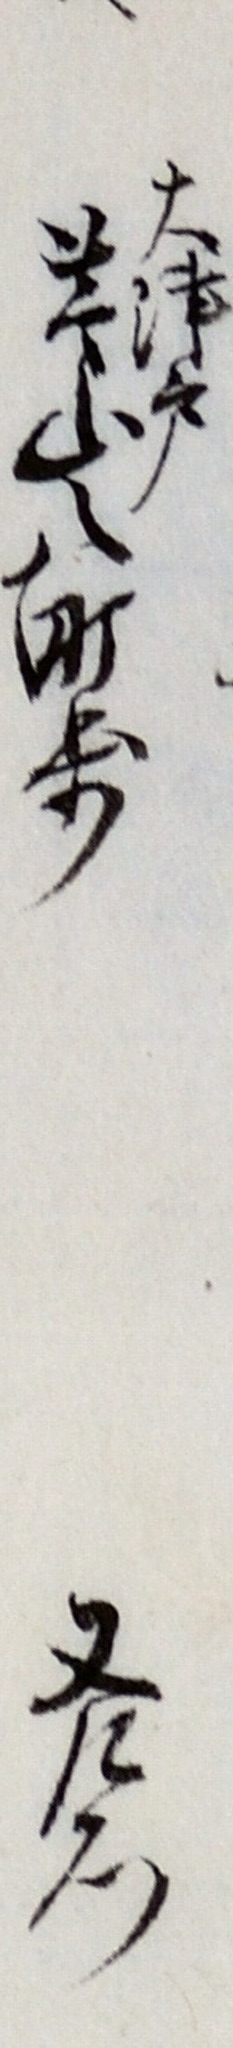芝山八町歩又左衛門
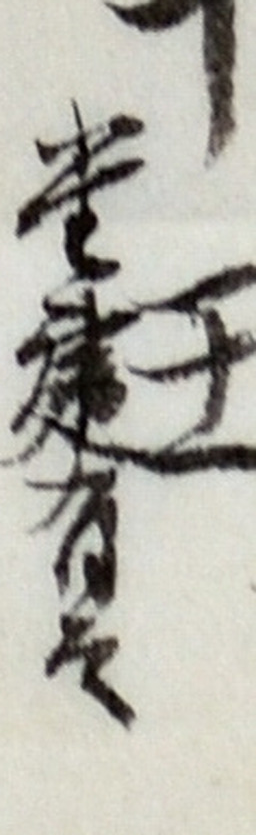堂建有之
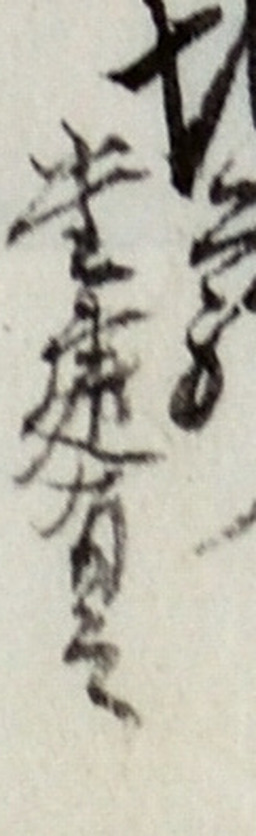堂建有之
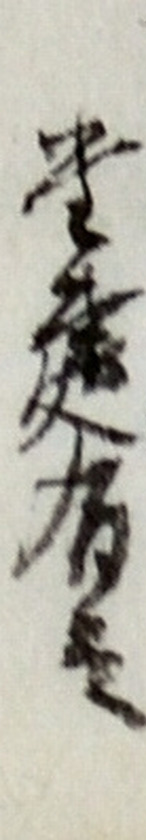宮建有之
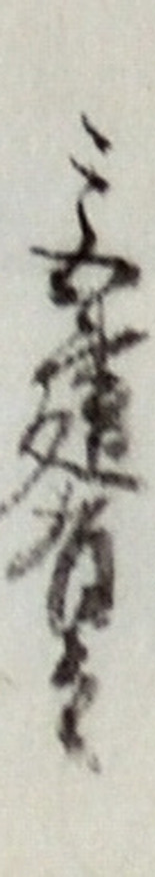宮建有之
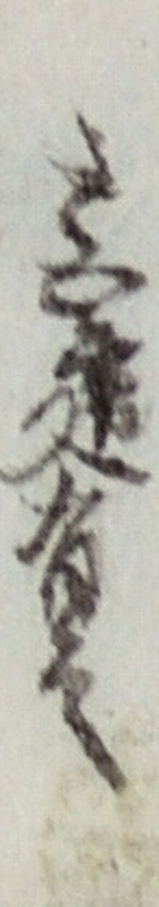宮建有之

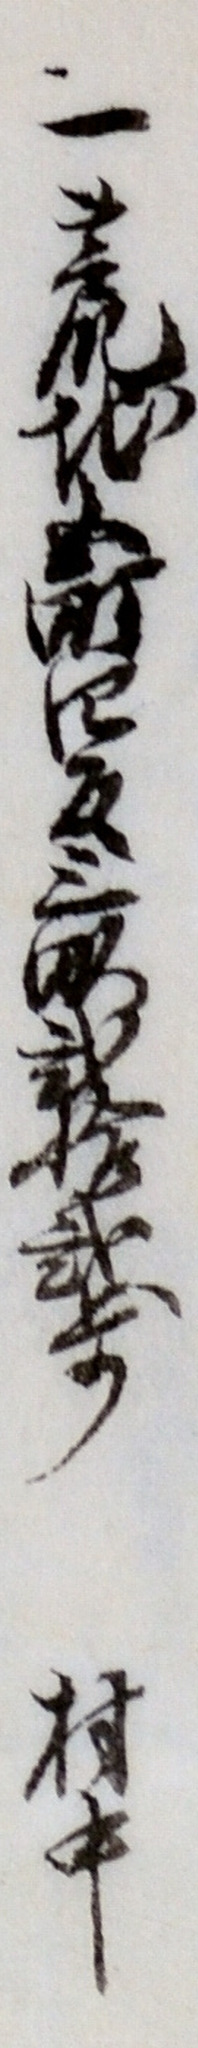一荒地五町四反三畝弐拾歩村中
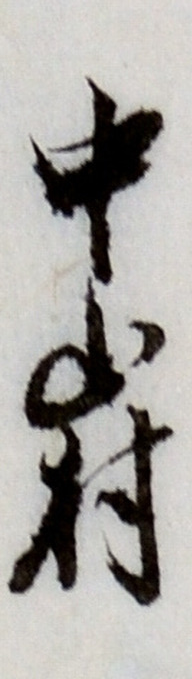中山村
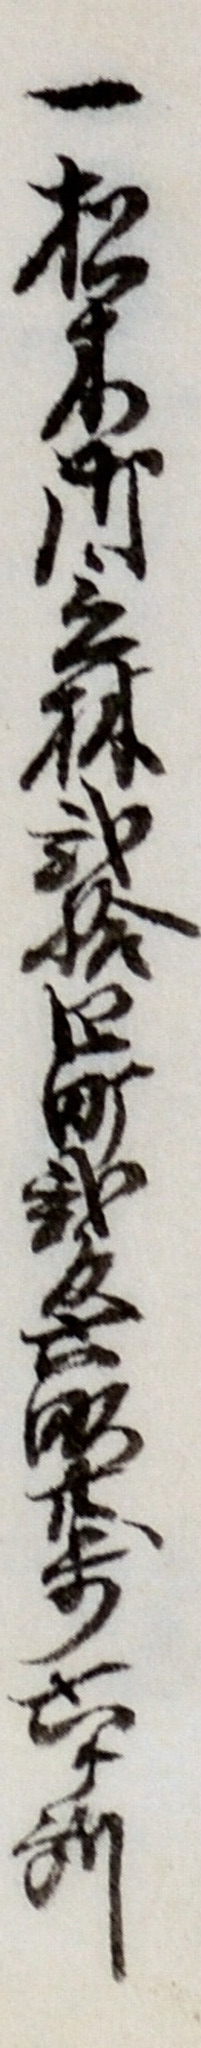一松木御立林弐拾四町弐反六畝廿歩六ヶ所
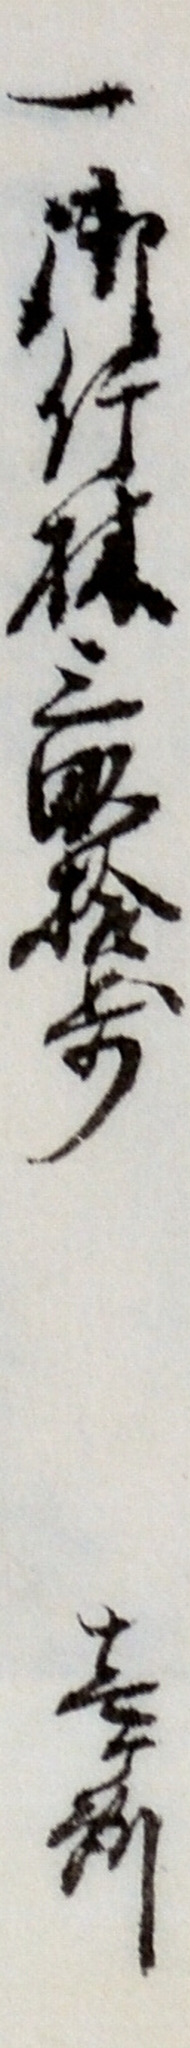一御竹林三畝拾歩壱ヶ所
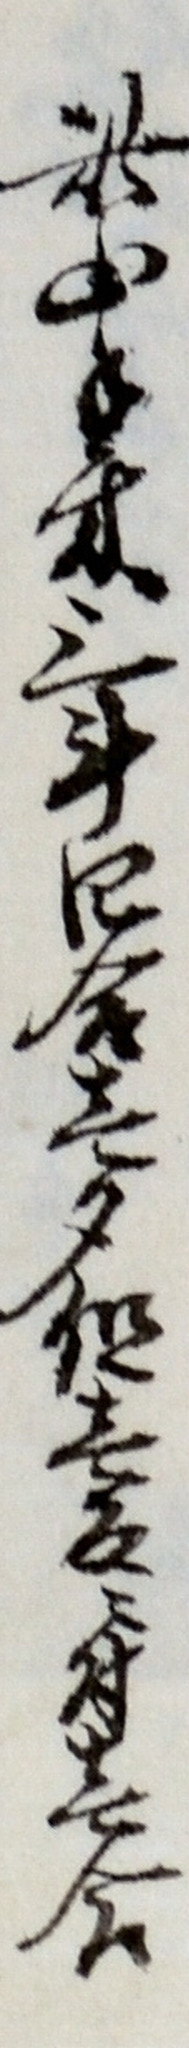此山手米三斗四合壱勺但壱反ニ付壱合

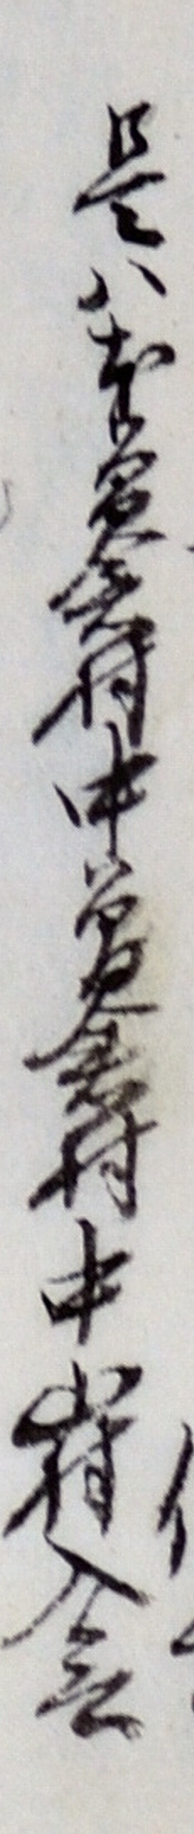是ハ本曾倉村中曾倉村中山村入会
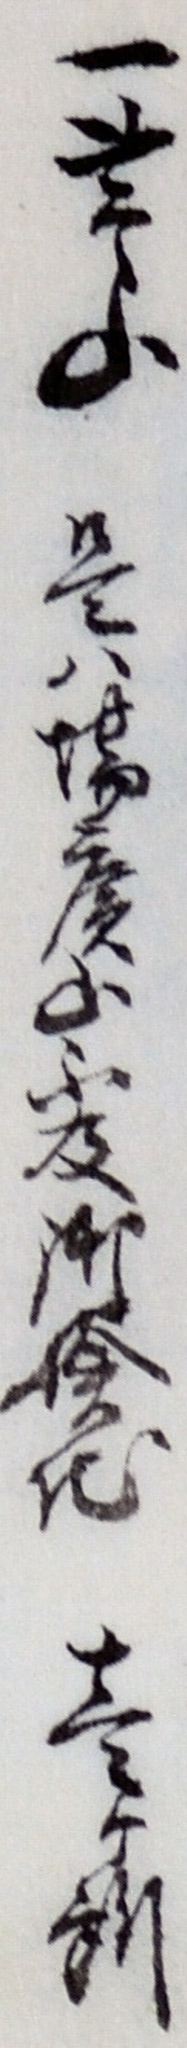一芝山是ハ場広山不及御検地壱ヶ所
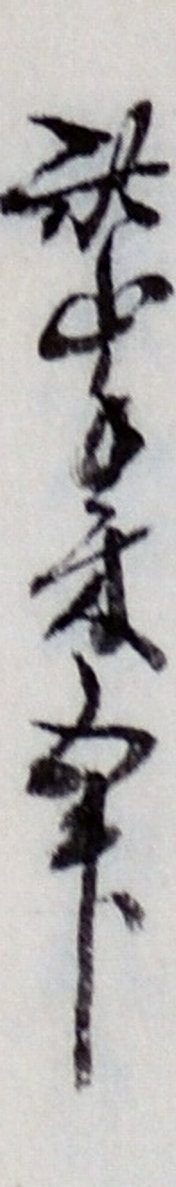此山手米五升
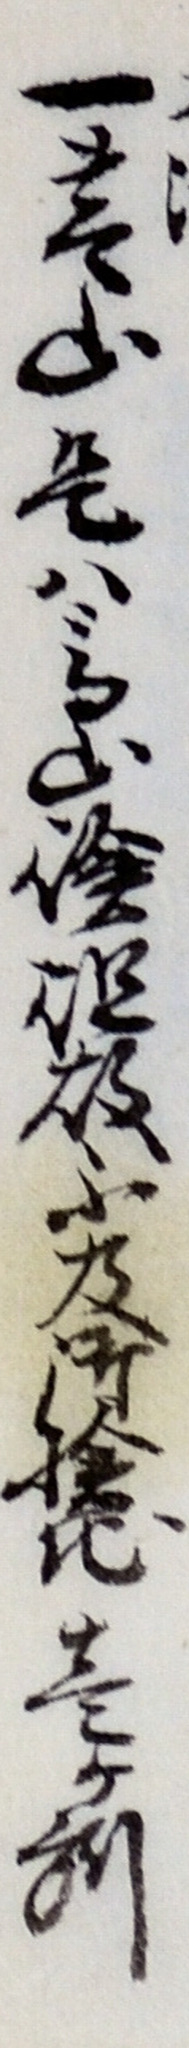一芝山是ハ高山嶮岨故不及御検地壱ヶ所
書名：御領分中山林社地手控
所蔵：伊那市立高遠町図書館・合同会社AMANE
